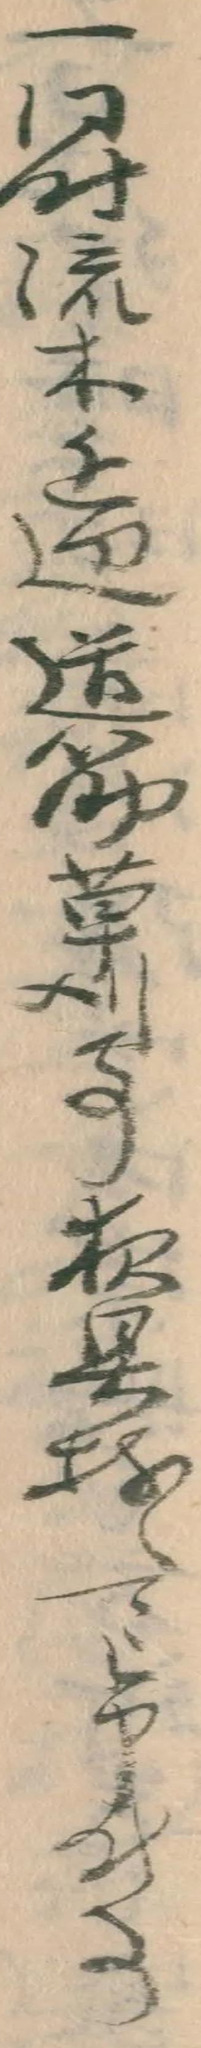一同時流木近辺道筋草刈事夜具持候可被申付事
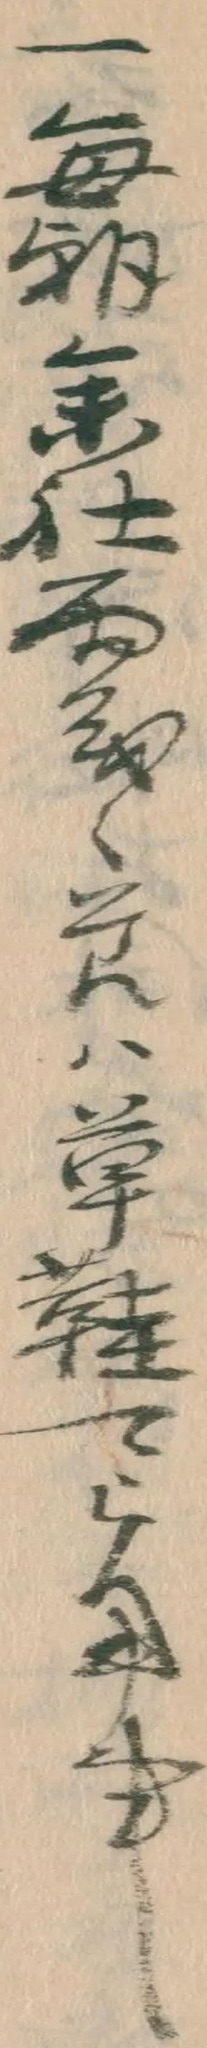一毎朝参社雨義之節ハ草鞋可被用事
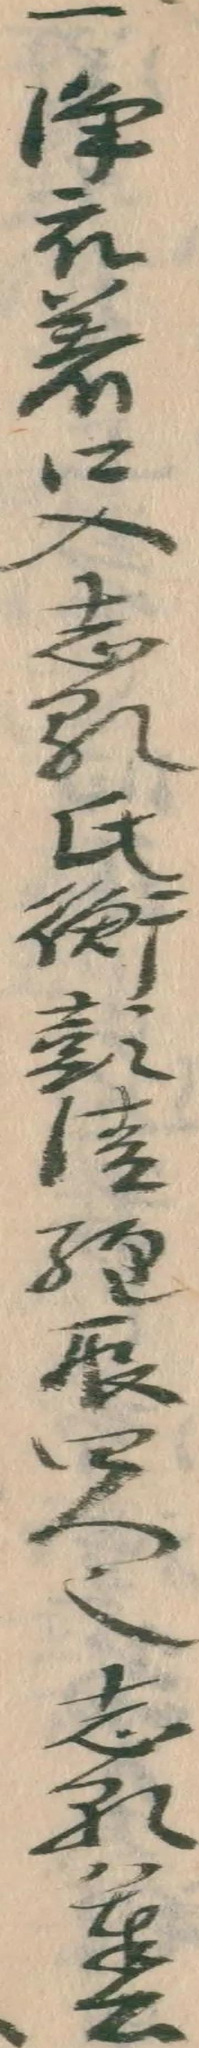一浄衣着口入志顕氏衡彭清経辰四人也志願ハ奉公
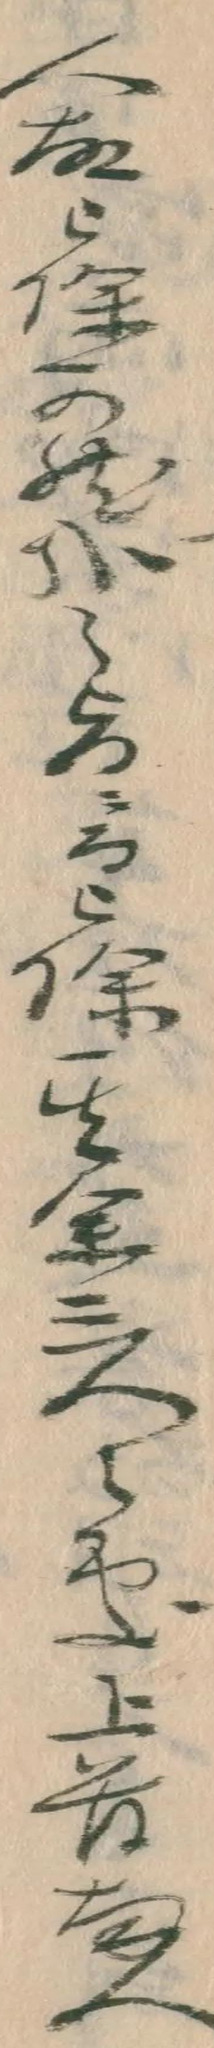人故被除可然哉之旨ニ而被除其余三人之處上首両人
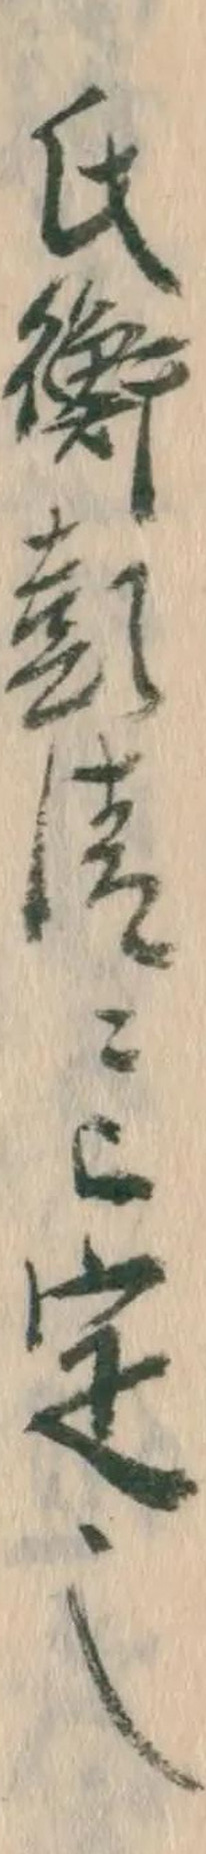氏衡彭清ニ被定也
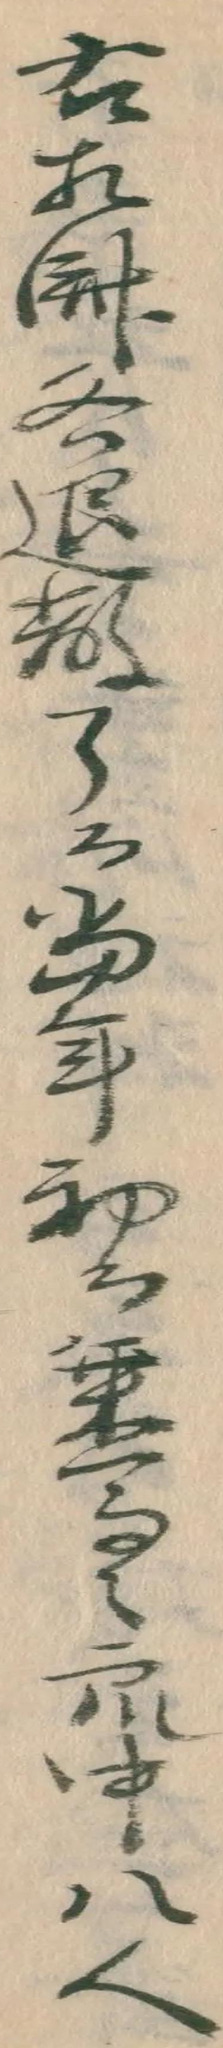右相済各退散了而當年初而乗馬之衆中八人
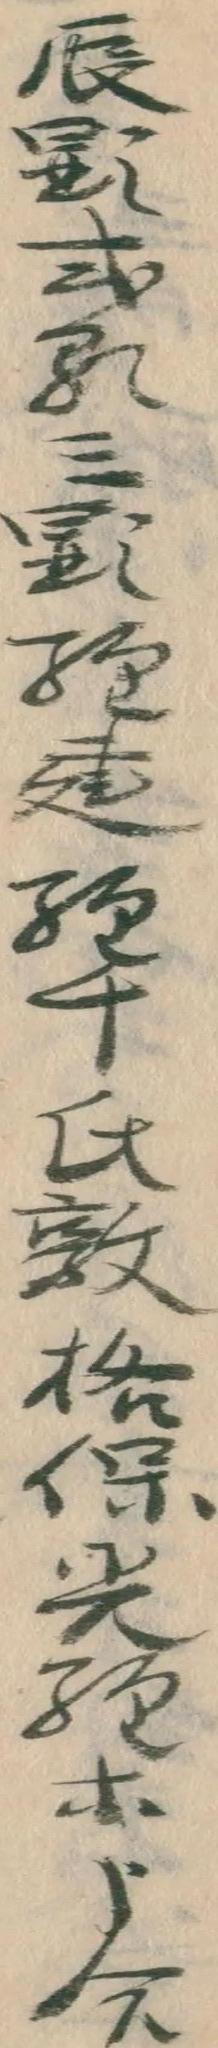辰顕式顕類三顕経建経千氏敦格保光経等申合
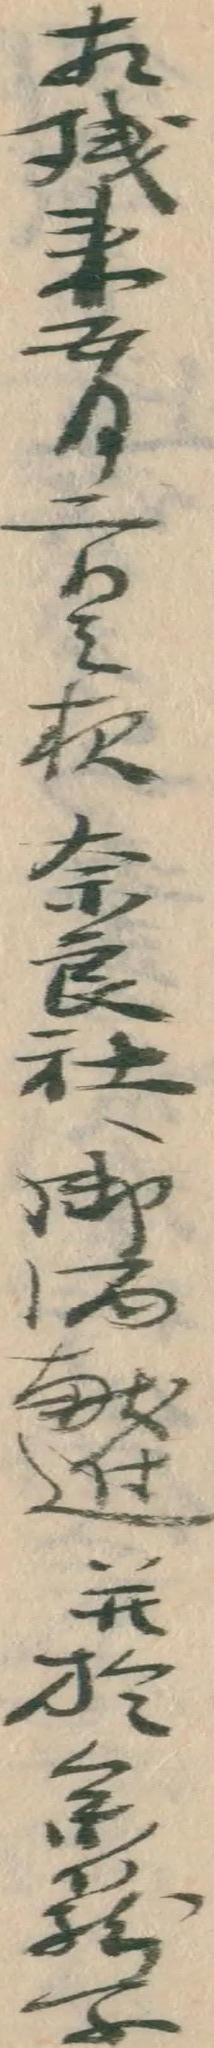相残来五月二日之夜奈良社へ御酒献進并於参籠所
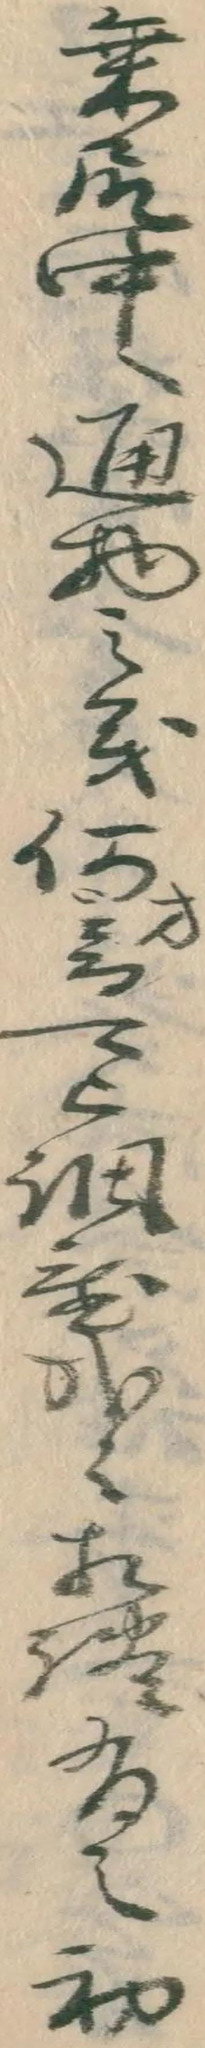乗尻中へ通物之義何方ニ而可被調置哉と相談有之初
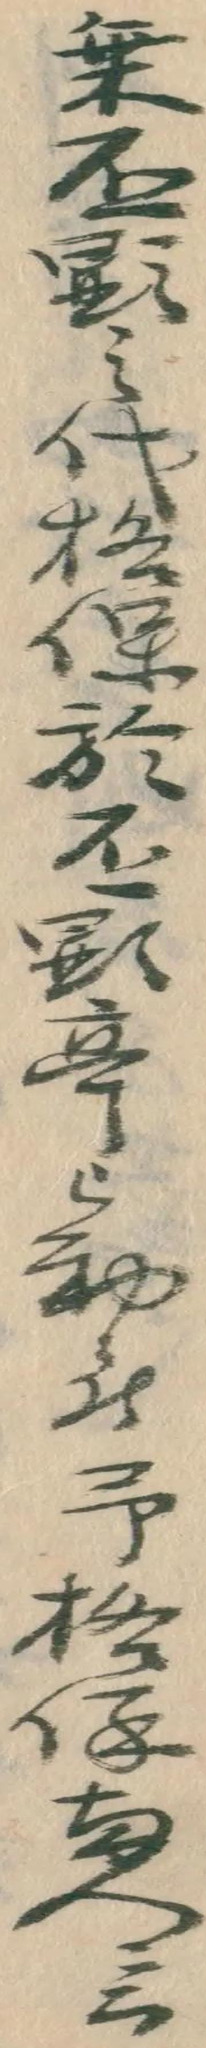乗丕顕之代格保於丕顕亭被勤候ニ付予格仮両人ニ而
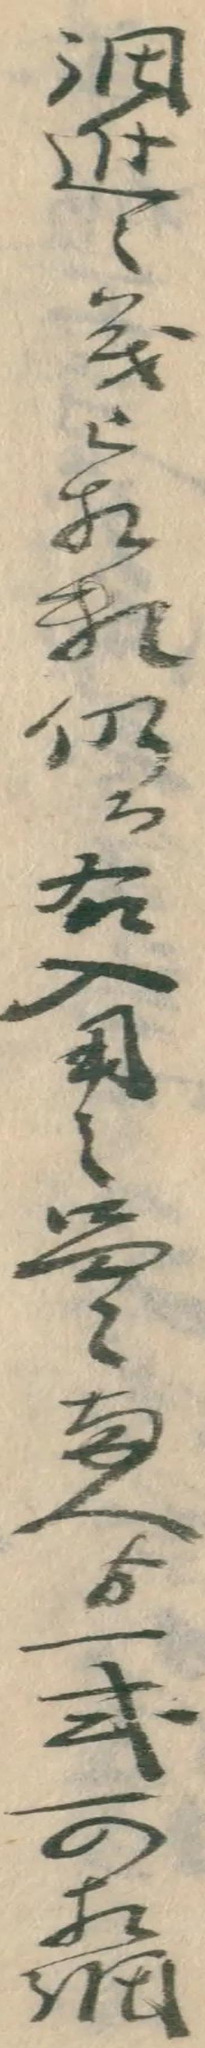調進之義被相頼仍而右入用之品々両人ゟ一式可相調
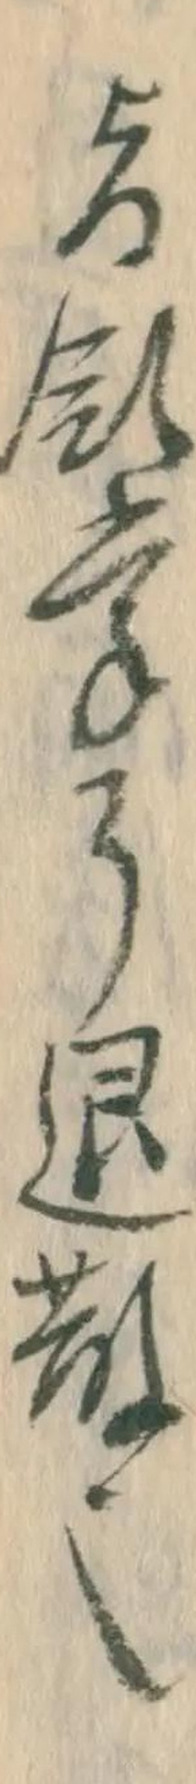旨領掌了退散也

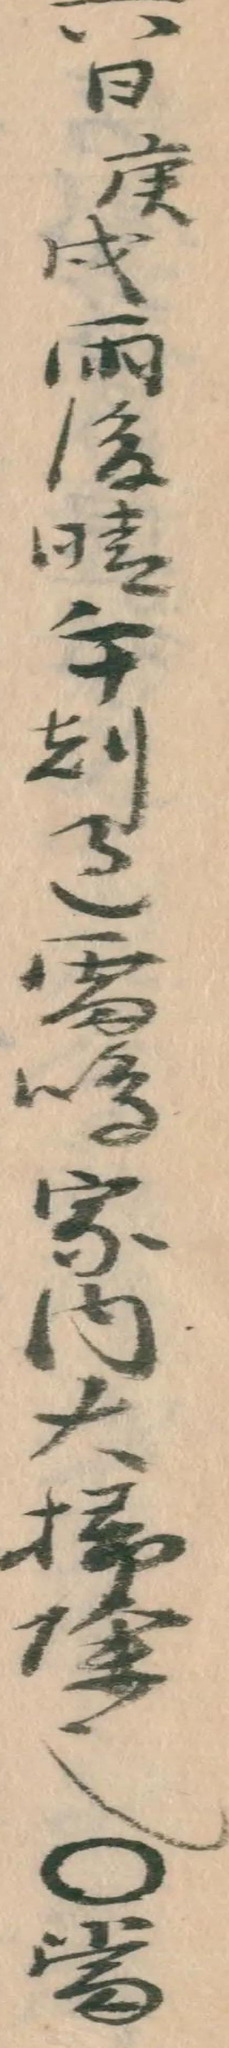六日庚戌雨後晴午刻過雷鳴家内大掃除也○當
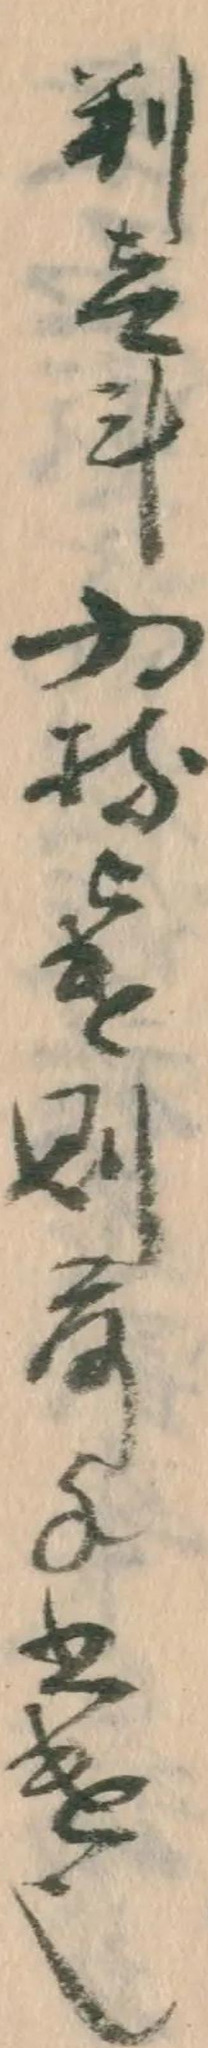判壱斗為持被遣則落手書遣也
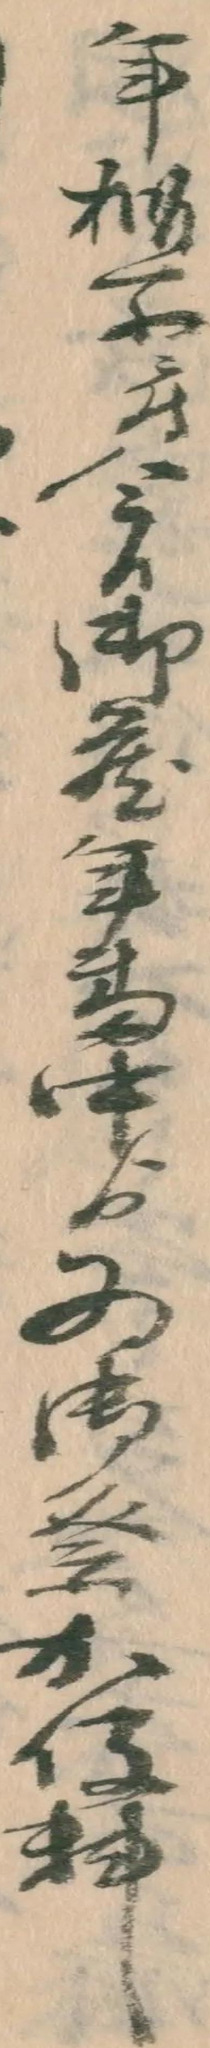年棚所ニ付今日御蔵年番中ゟ為御祭加役料
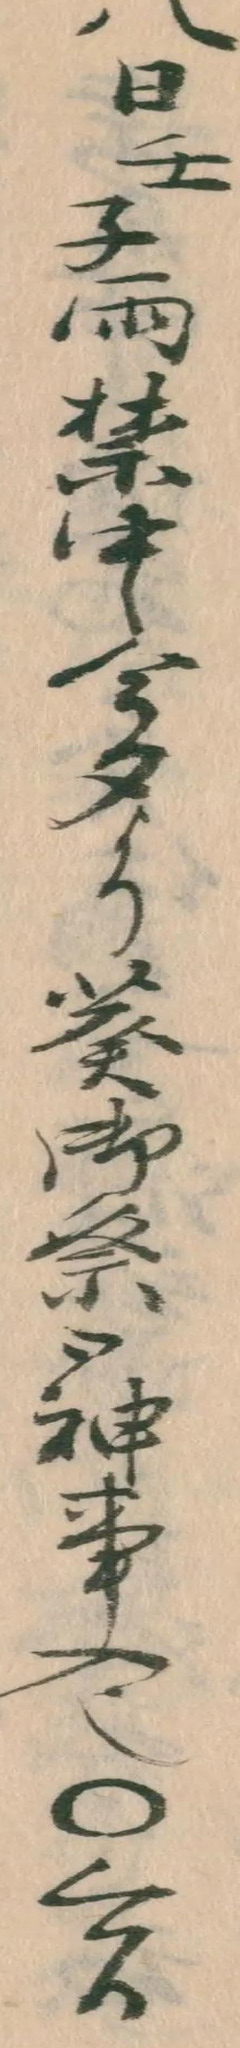八日壬子雨禁中今夕より葵御祭御神事入也〇今日
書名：賀茂社記録. 第63冊
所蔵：国立国会図書館 National Diet Library, JAPAN
